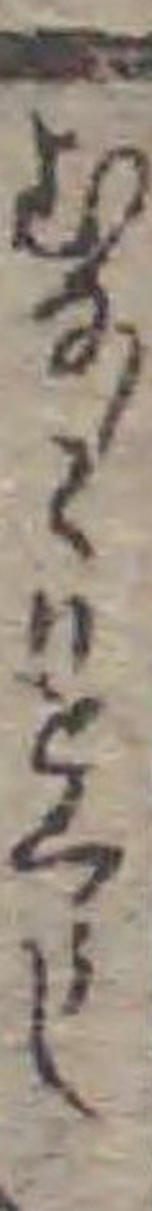むなしく日をくらし
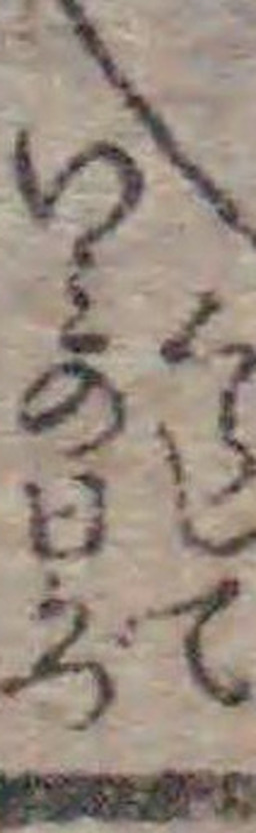いみの日かづ
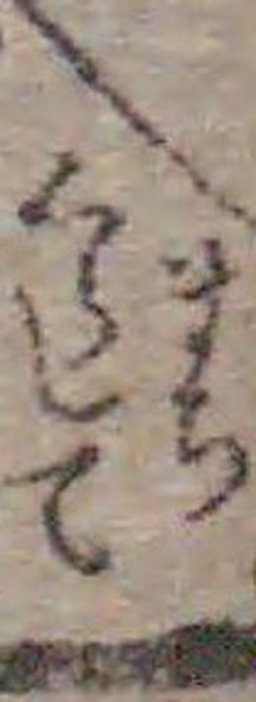くらして
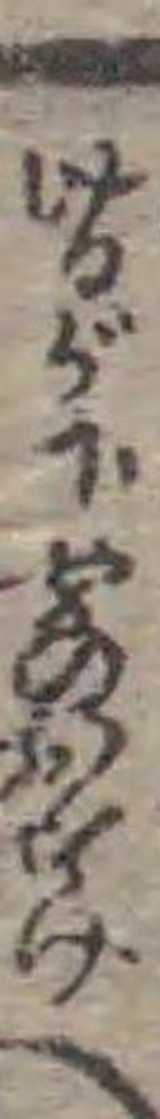けるが下女のおす？け
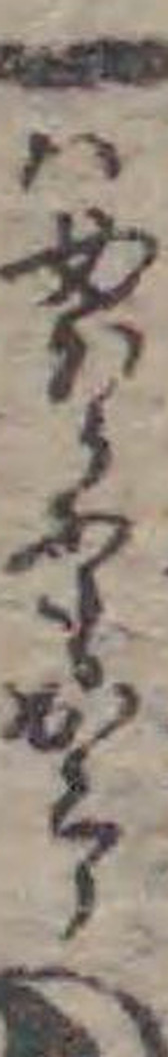は女ほうにもおとら
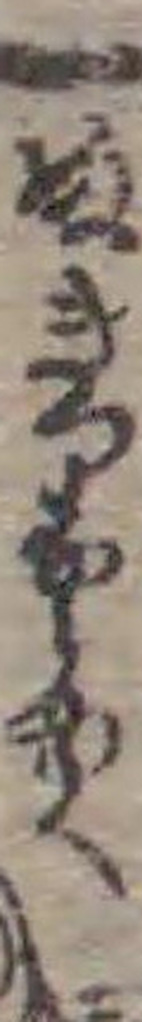ぬきりやうゆへ
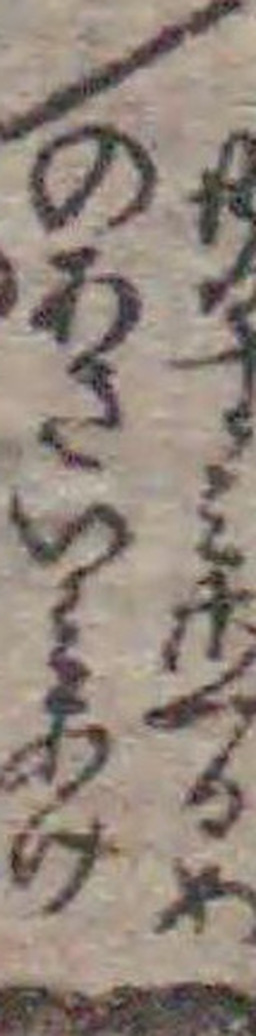のあさいみあけ
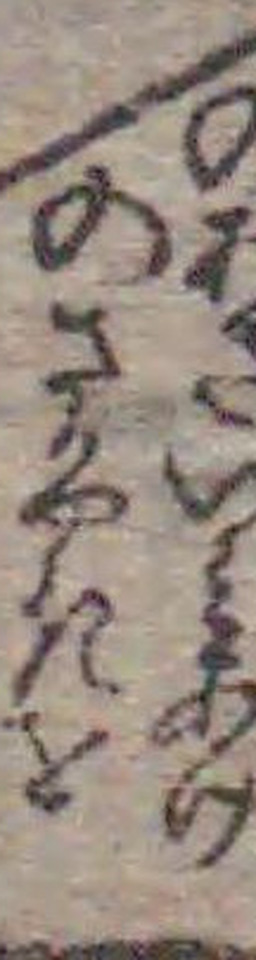のさかやきを
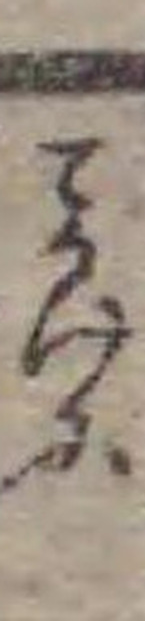てかけに
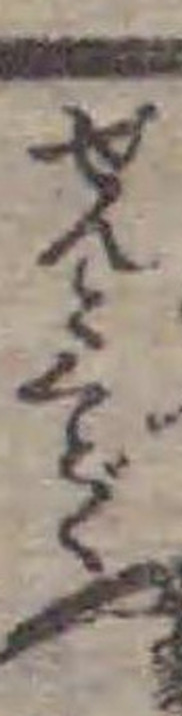せんとくどく
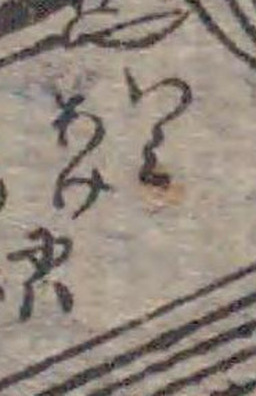あけには
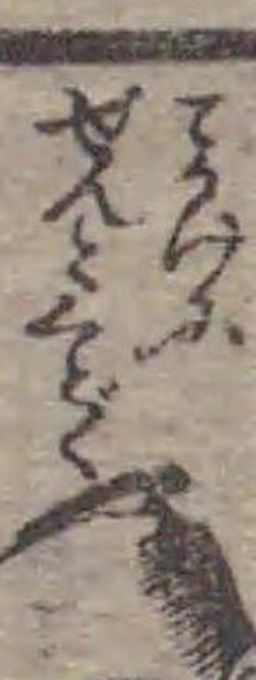せんとくどく
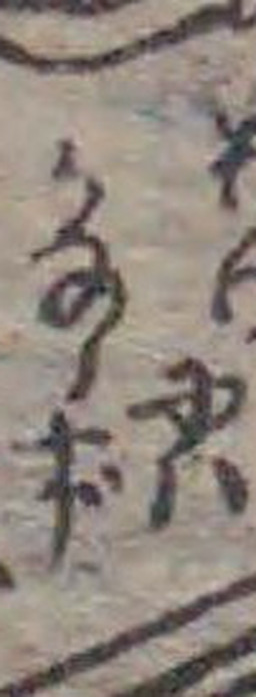かならす
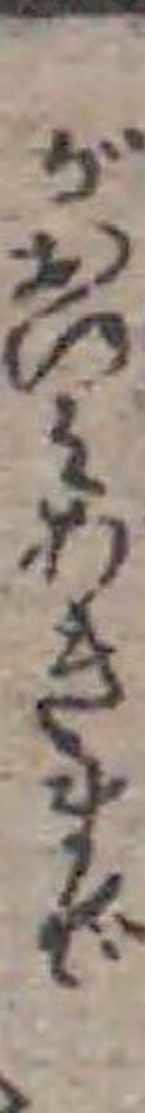がおいみあきまで
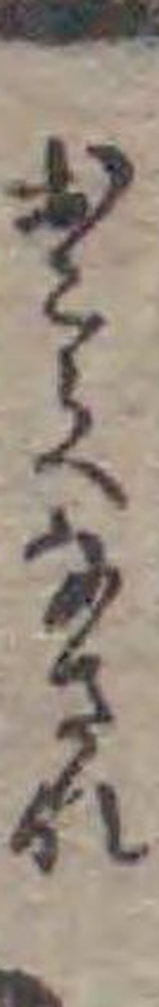おこらへなされ
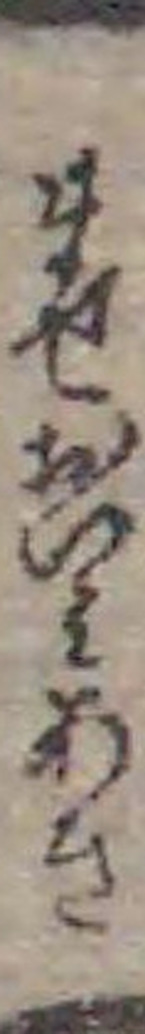ませおいみあき
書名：見徳一炊夢 : 3巻
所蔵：国立国会図書館 National Diet Library, JAPAN
